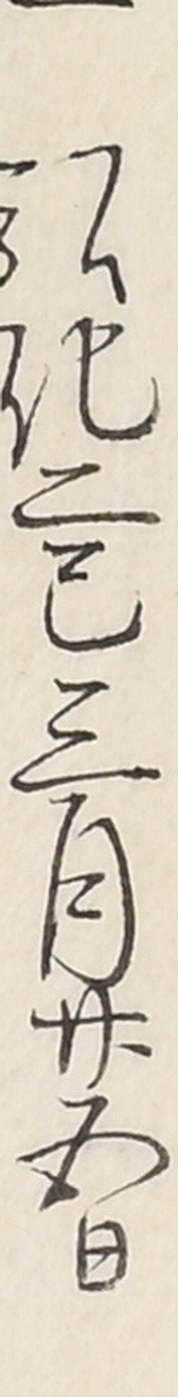一弘化二巳三月廿五日
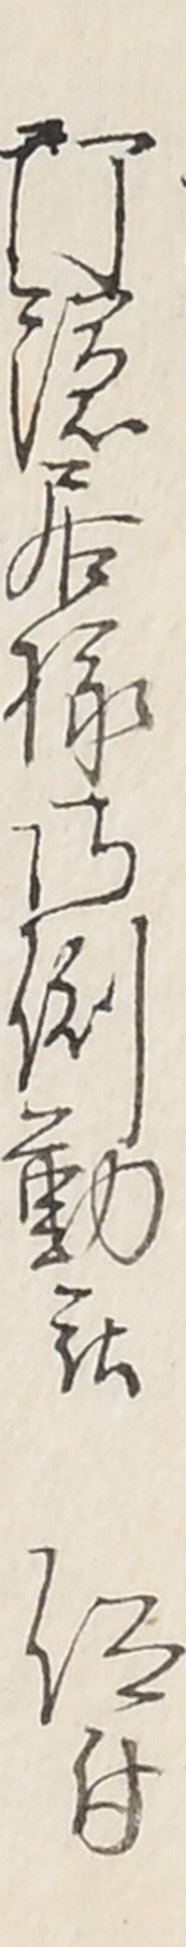御隠居様御側勤被仰付
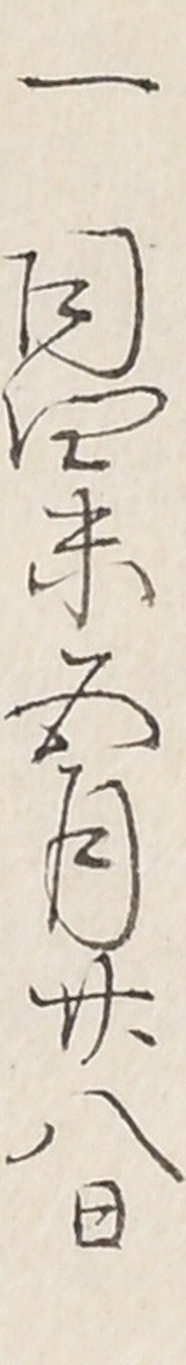一同四未五月廿八日
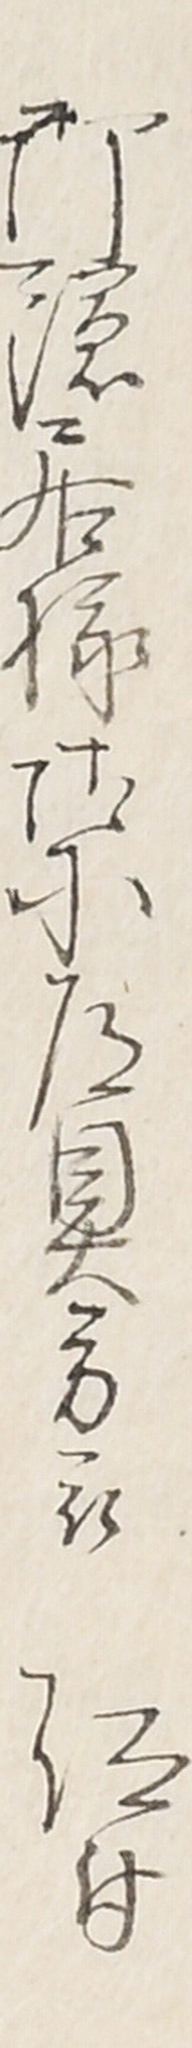御隠居様御小道具方被仰付
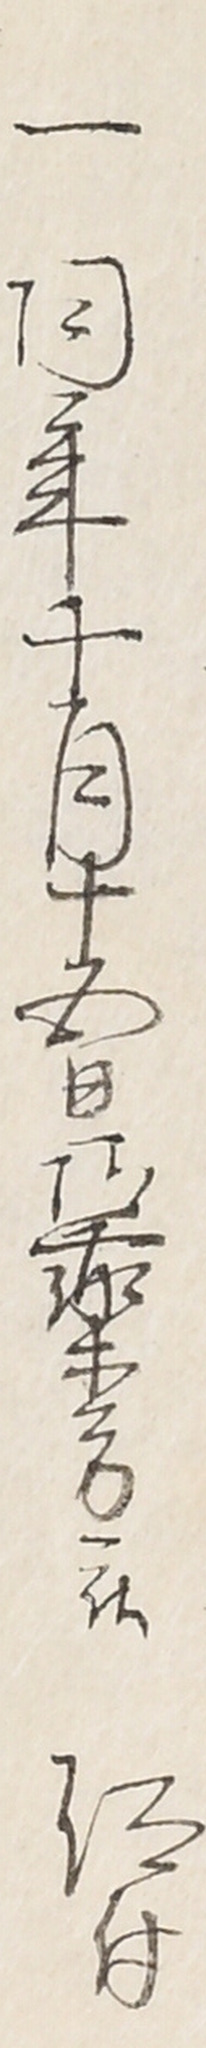一同年十月十五日御薬方被仰付
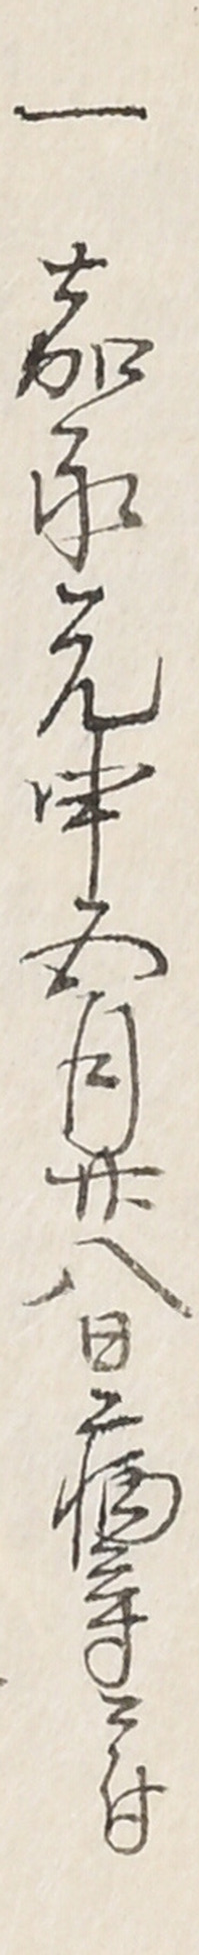一嘉永元申五月廿八日病気ニ付
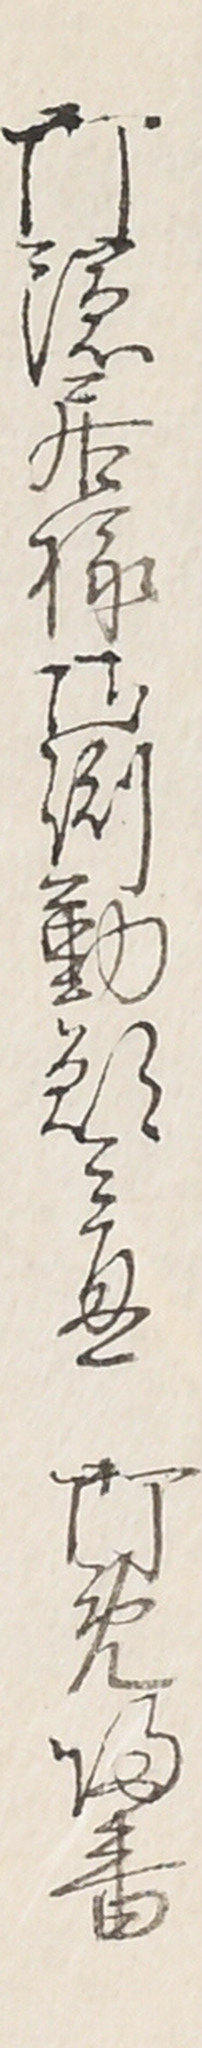御隠居様御側勤願之通御免帰番
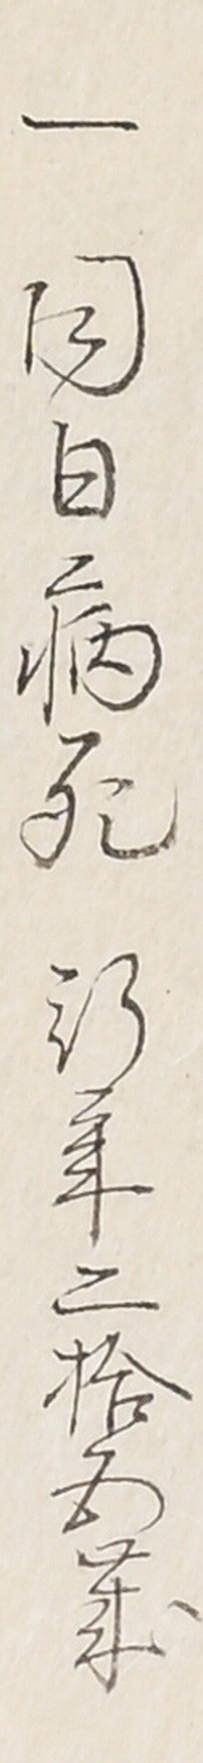一同日病死行年二拾五歳
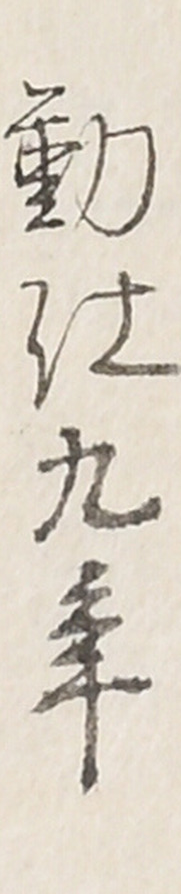勤仕九年
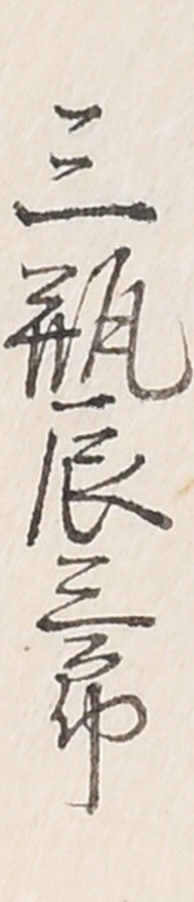三瓶辰三郎
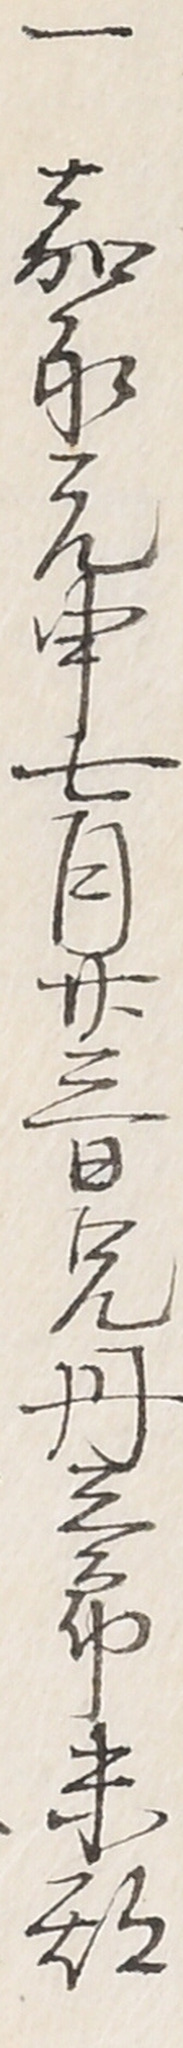一嘉永元申七月廿三日兄丹三郎末期
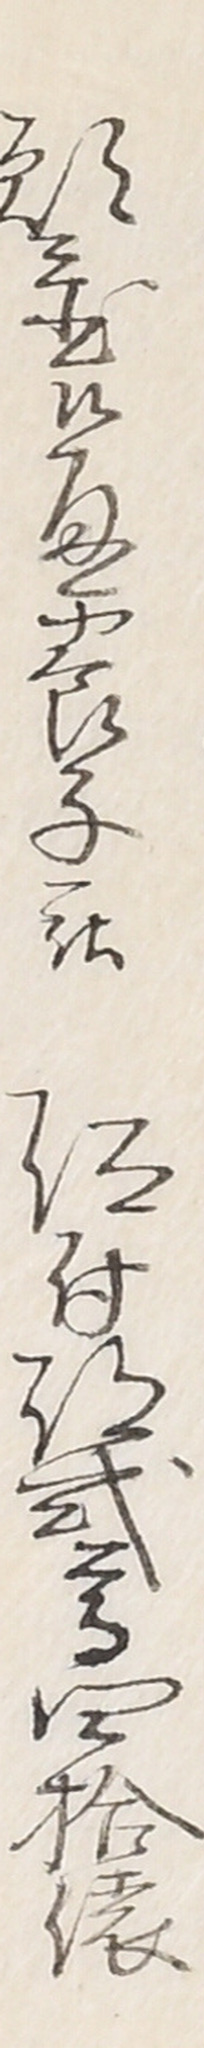願置候通養子被仰付跡式高四拾俵
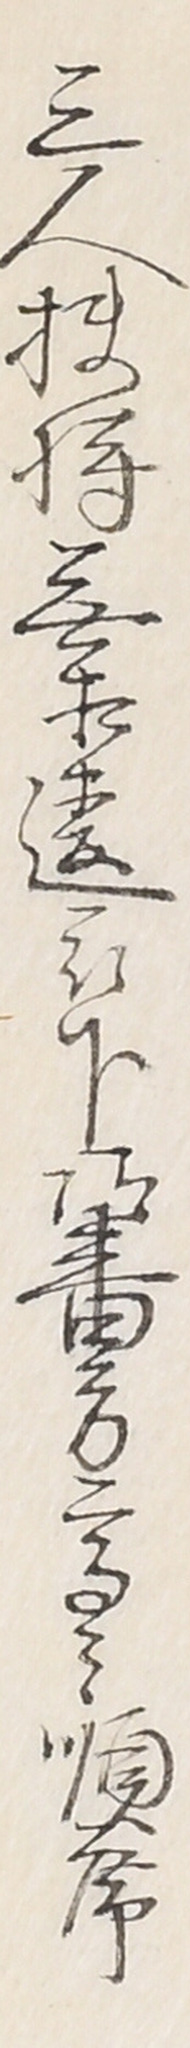三人扶持無相違被下御番方高之順席
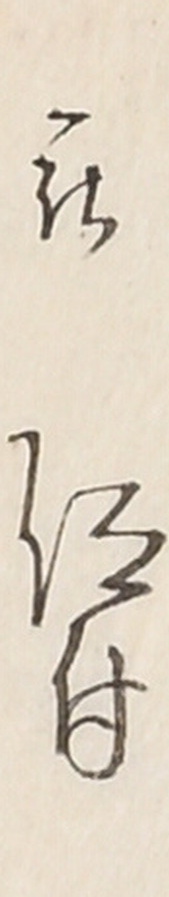被仰付
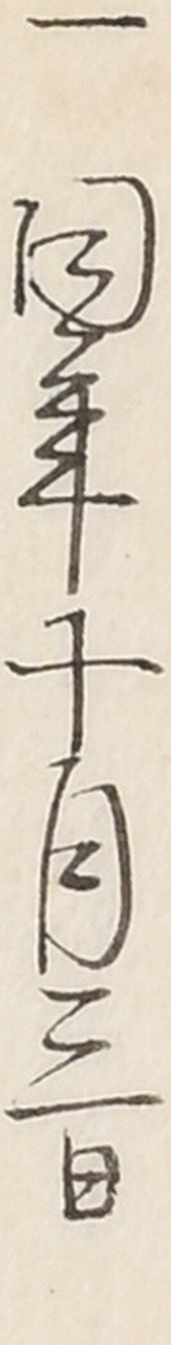一同年十月三日
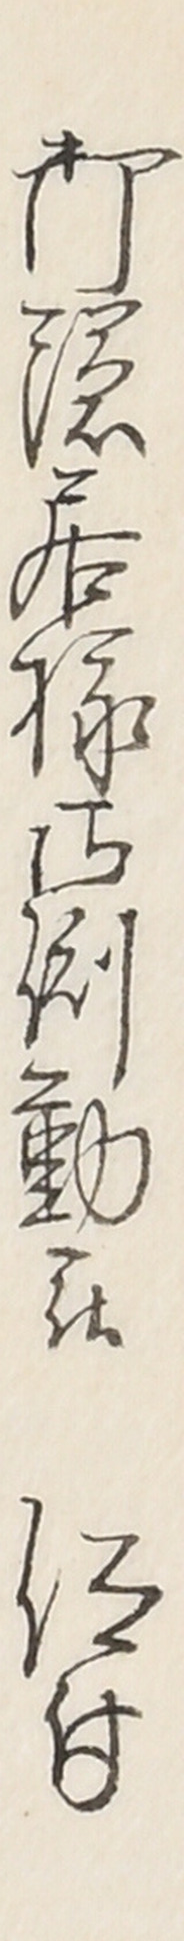御隠居様御側勤被仰付
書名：給人諸士勤仕録（七）
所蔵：伊那市立高遠町図書館・合同会社AMANE
